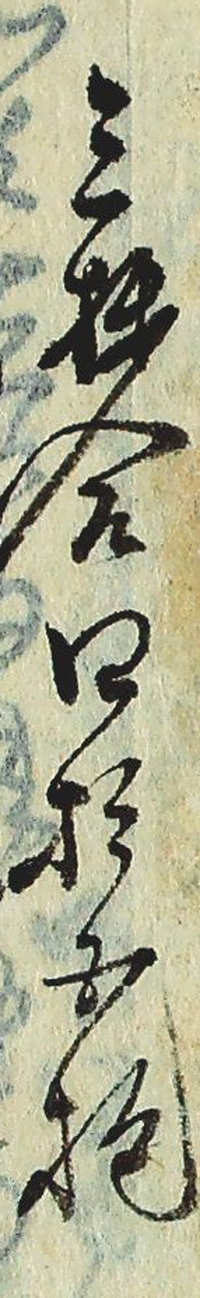三株合四拾五把
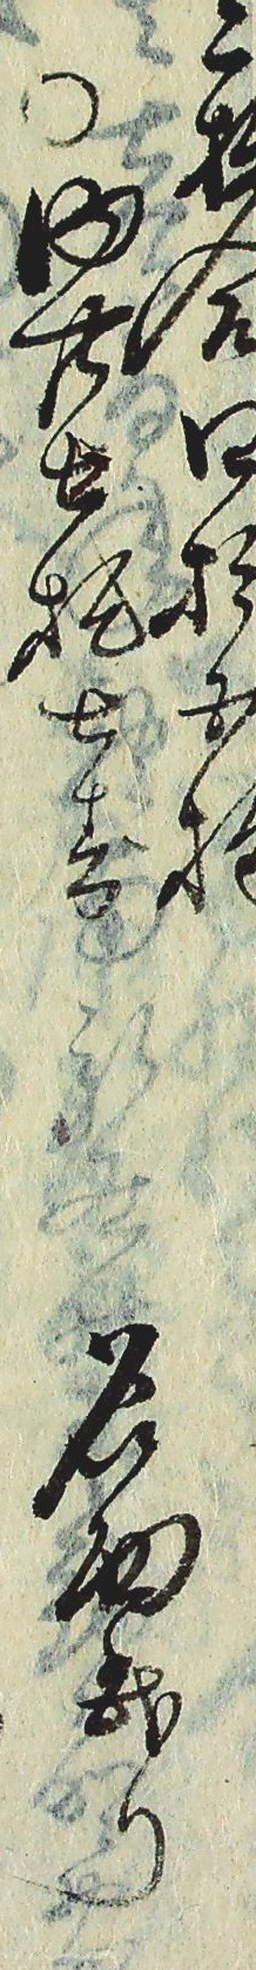内廿七把七歩名西当り
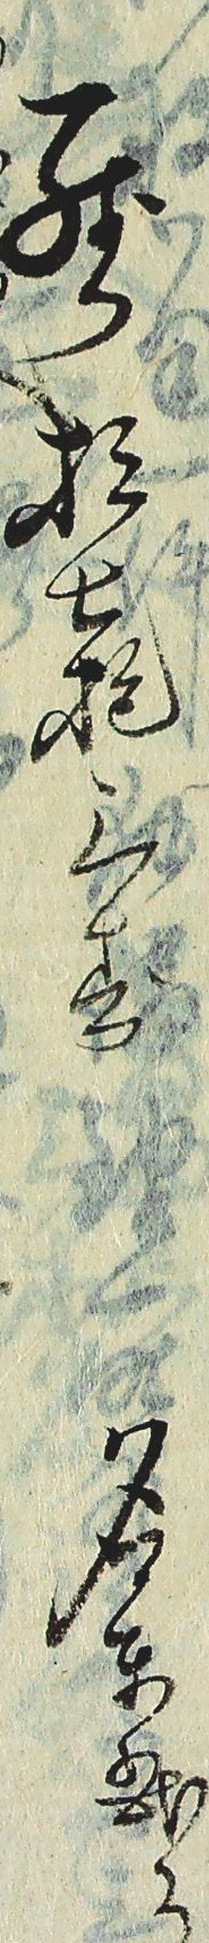残り拾七把三歩名東当り
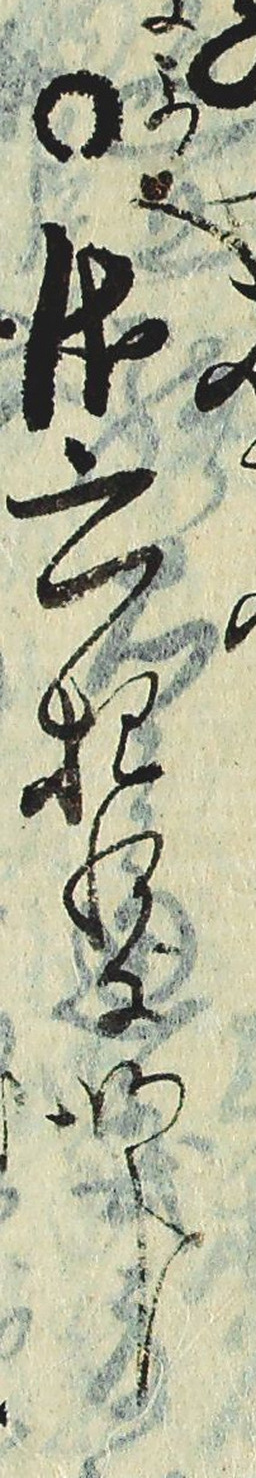代六拾九匁弐分
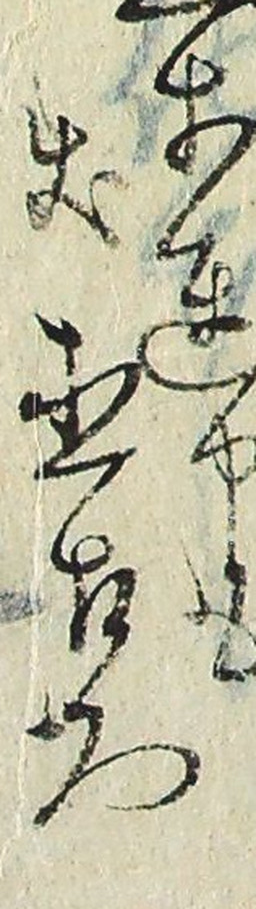使直左衛門

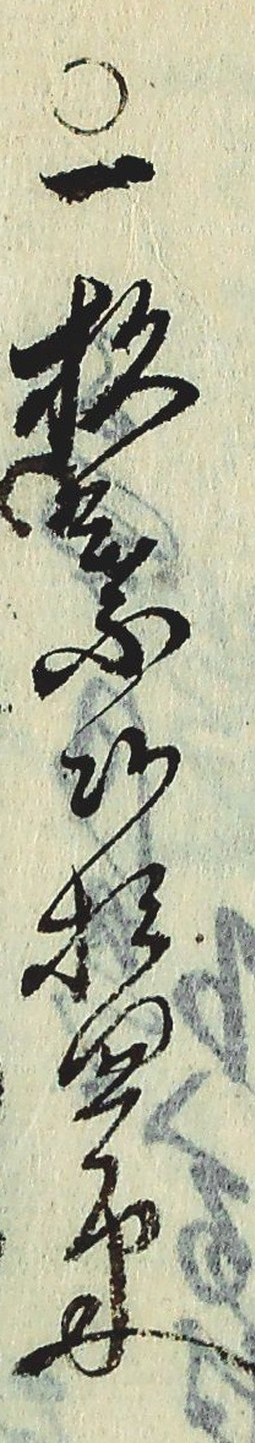一杉葉弐拾四束
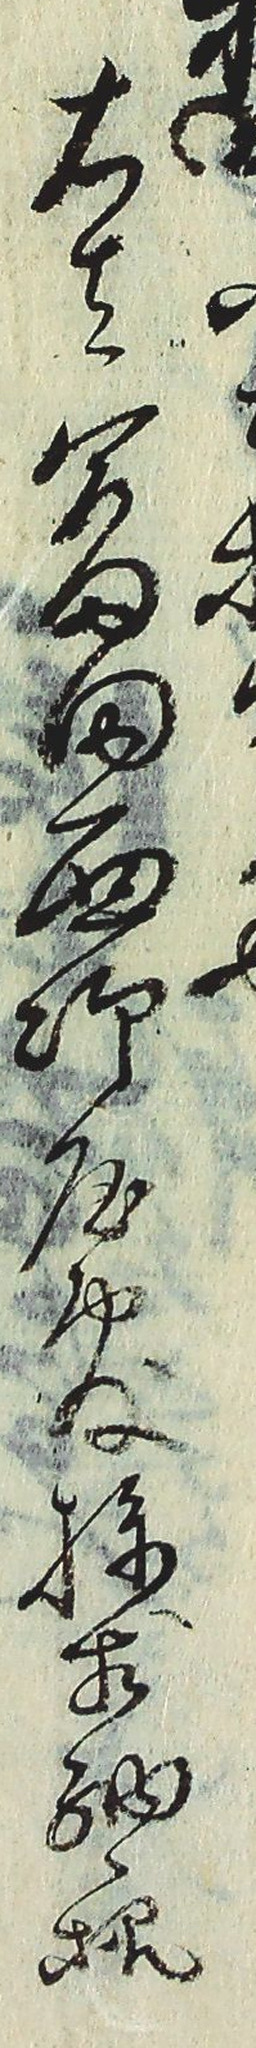右は富田西御屋敷様相納候様
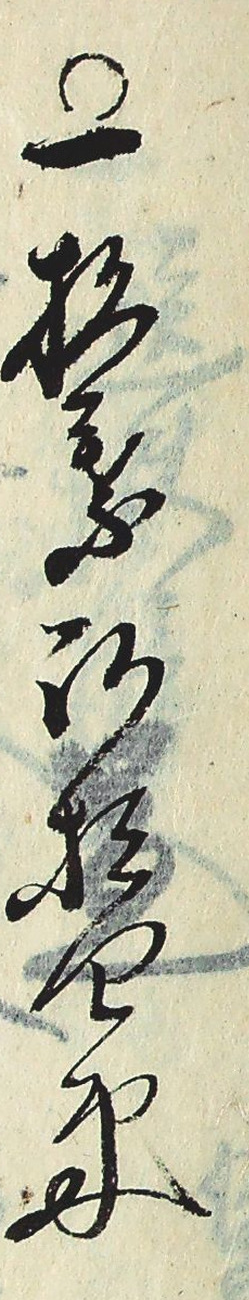一杉葉弐拾四束
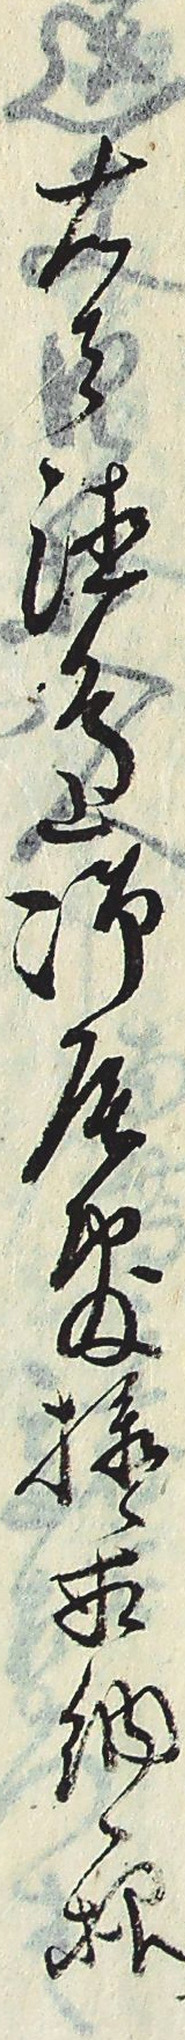右は徳島御屋敷様へ相納候様

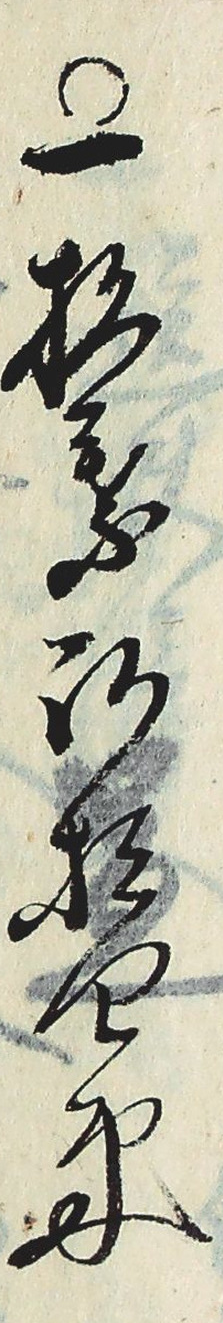一杉葉弐拾四束
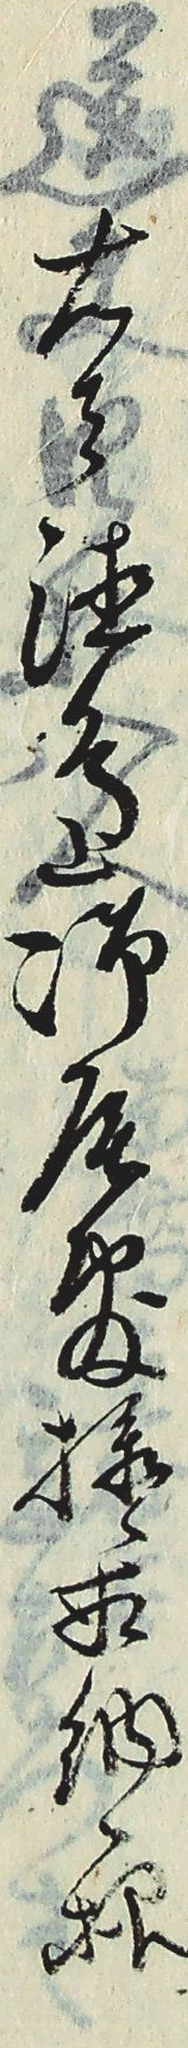右は徳島御屋敷様へ相納候様
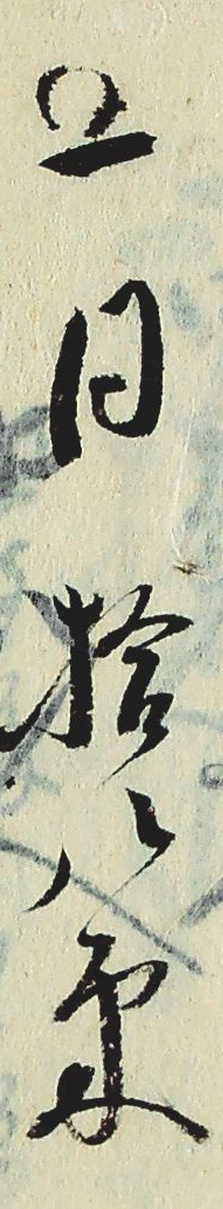一同拾八束
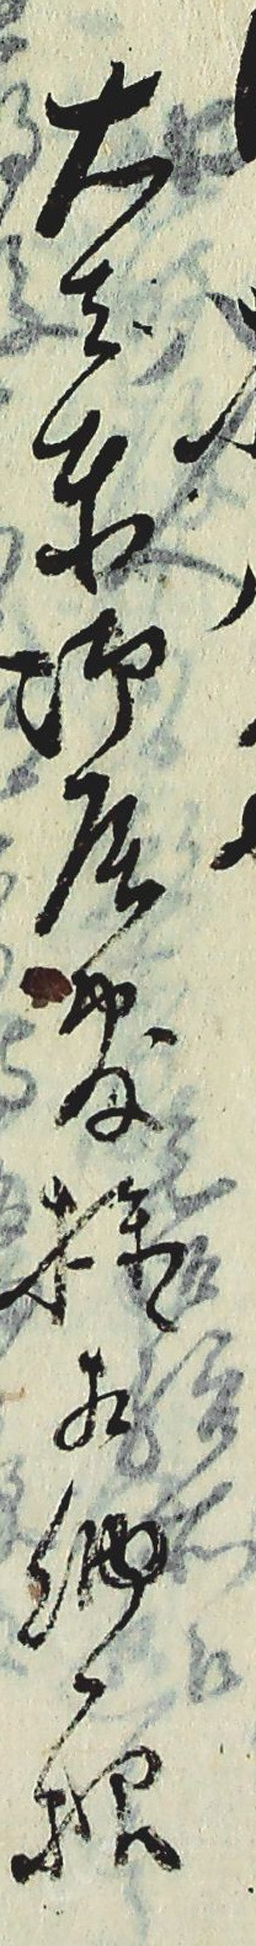右は東御屋敷様へ相納候様
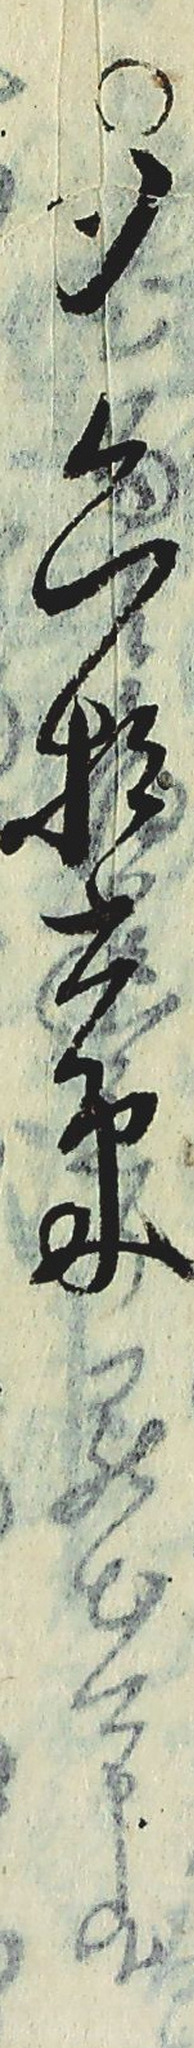〆六拾六束
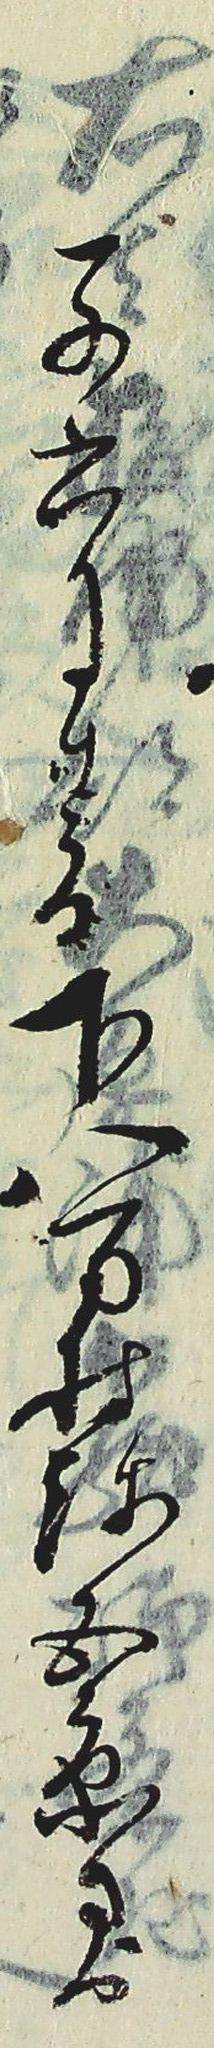子六月十三日下八万村弥五兵衛方ゟ
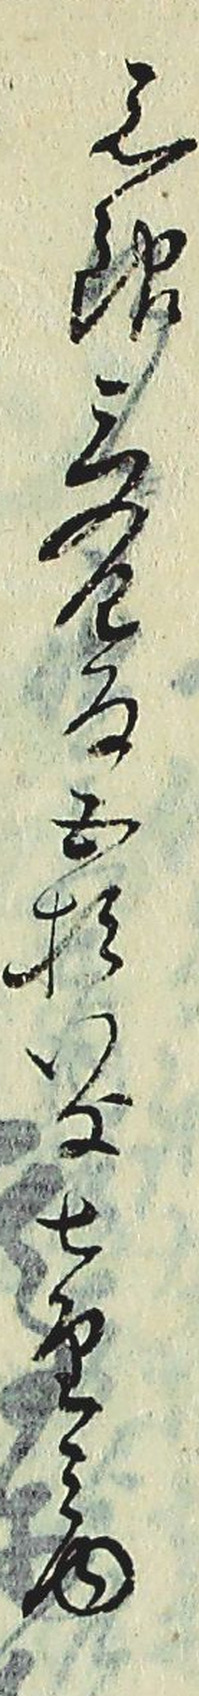元銀三〆四百五拾八匁七厘之内
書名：名東郡中諸割賦元帳
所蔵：鳴門教育大学 Naruto University of Education
